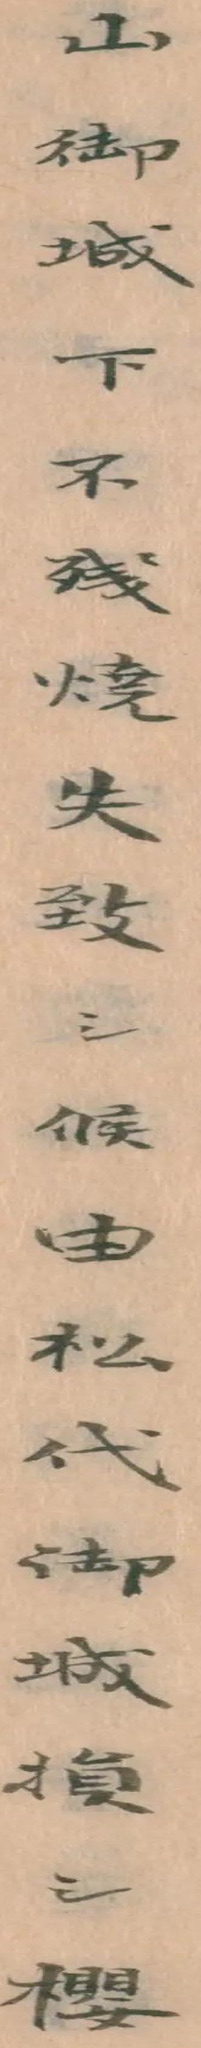山御城下不残焼失致シ候由松代御城損シ桜
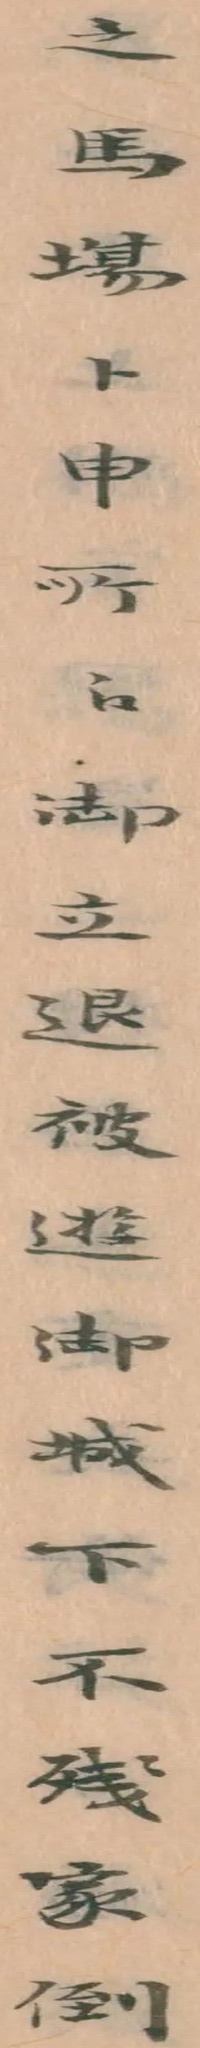之馬場ト申所江御立退被遊御城下不残家倒
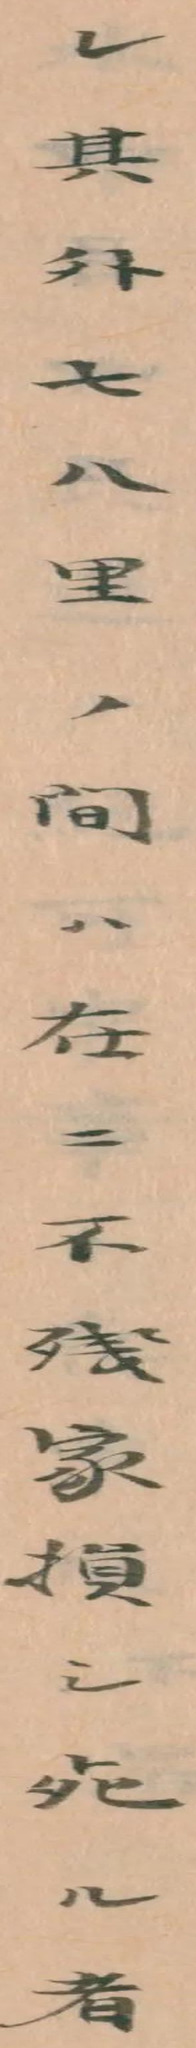レ其外七八里ノ間ハ在二不残家損シ死ル者
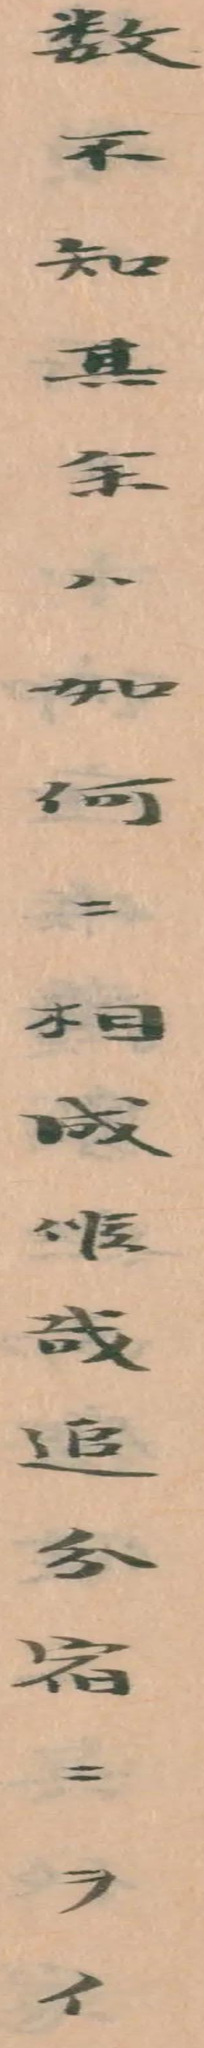数不知其余ハ如何二相成候哉追分宿二ヲイ
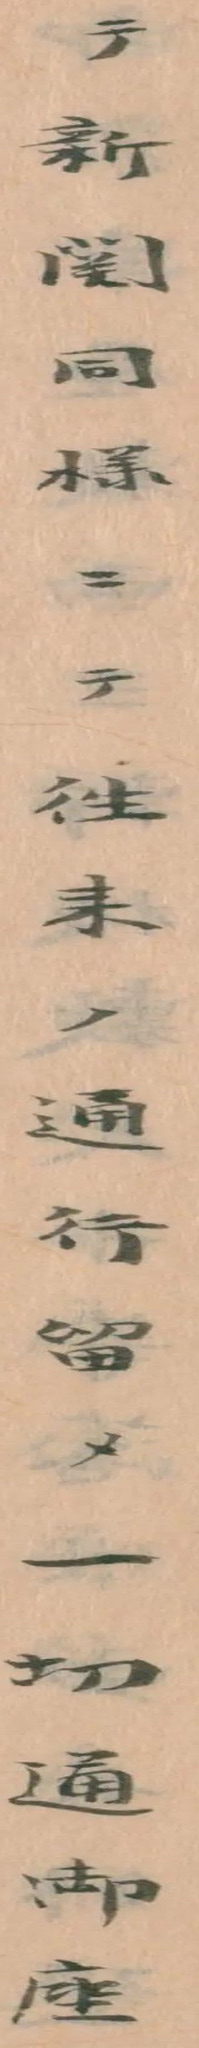テ新関同様ニテ往来ノ通行留メ一切通御座
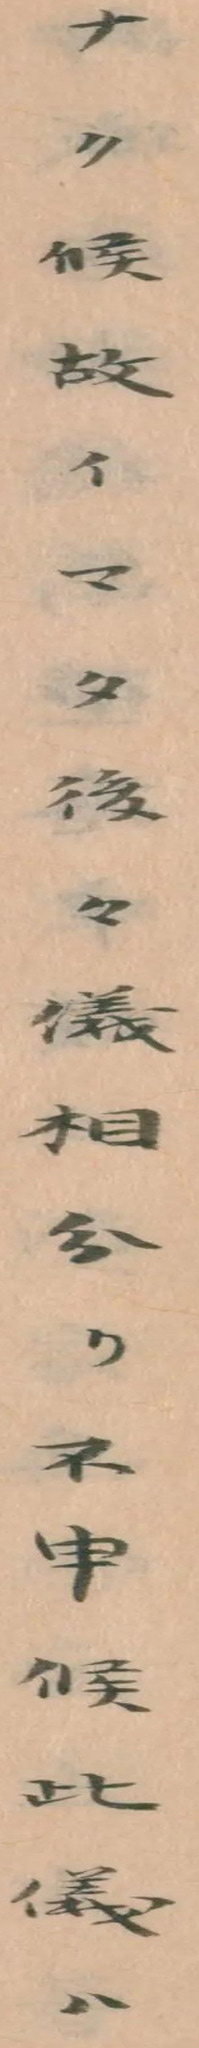ナク候故イマタ後々儀相分り不申候此儀ハ
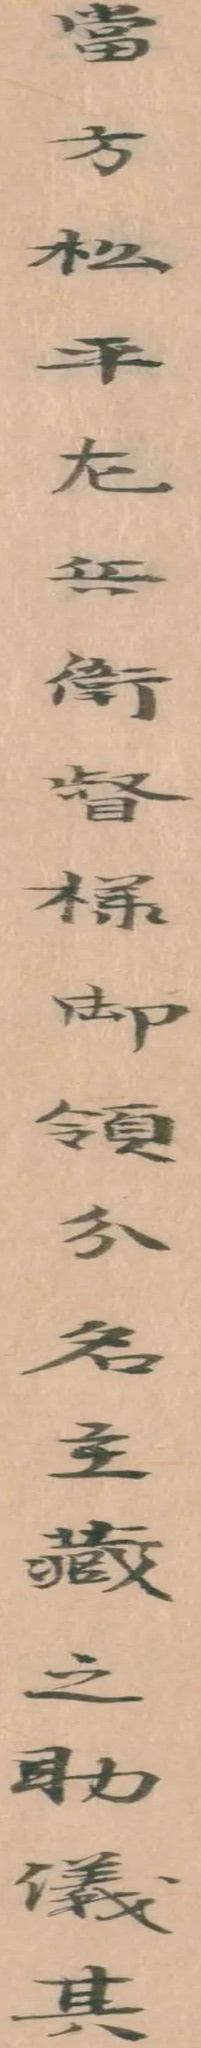当方松平左兵衛督様御領分名主蔵之助儀其
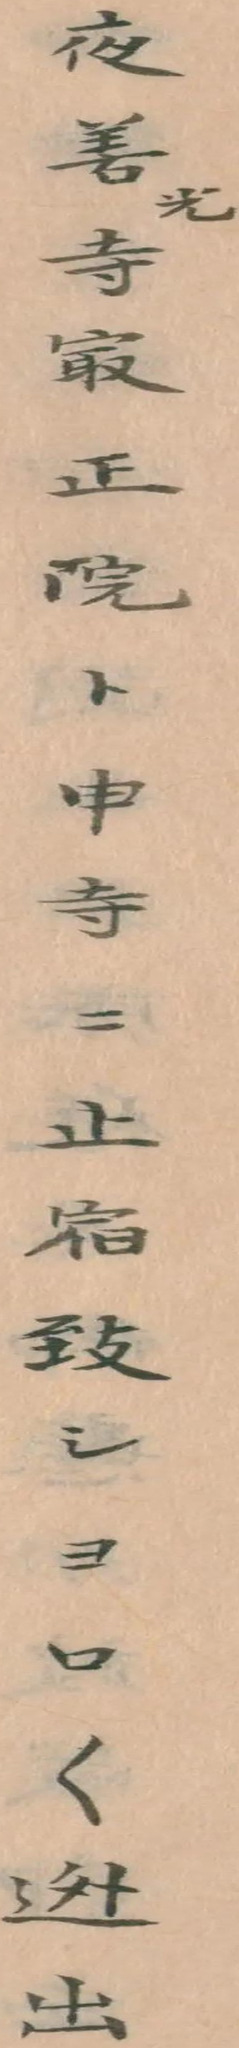夜善光最正院ト申寺二止宿致シヨロ〳〵逃出
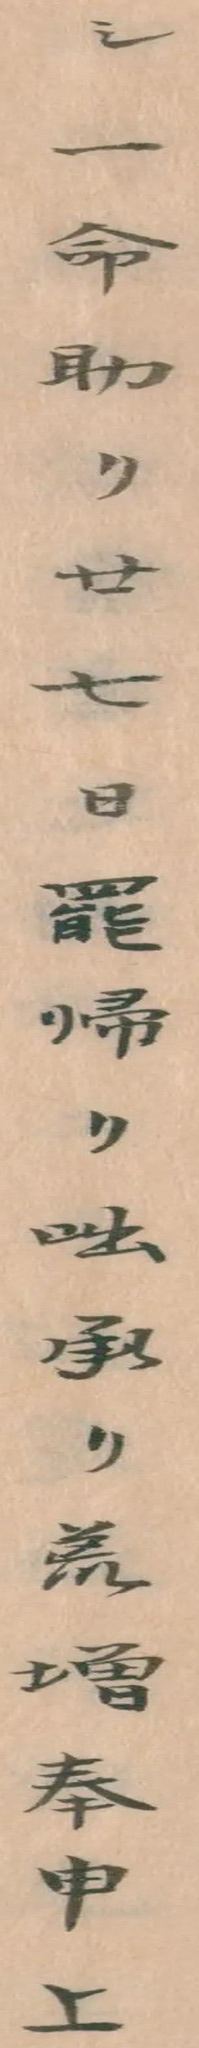シ一命助り廿七日罷帰り咄承り荒増奉申上
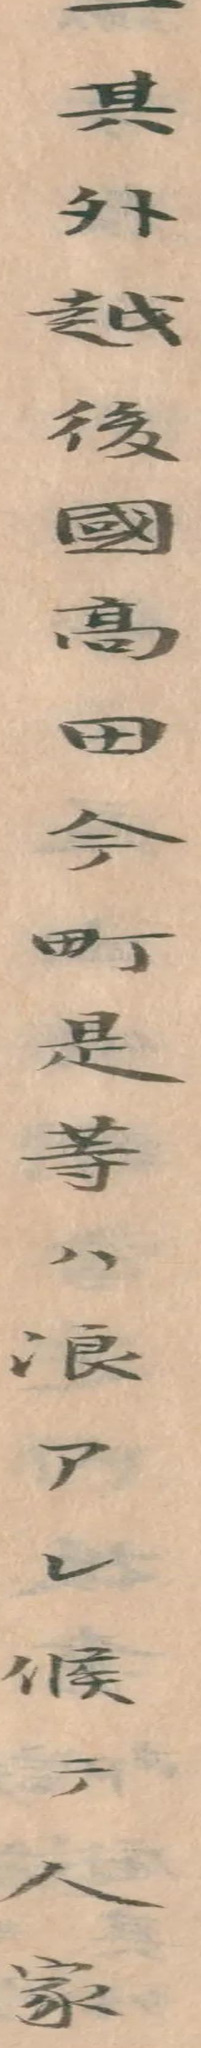一其外越後国高田今町是等ハ浪アレ候テ人家
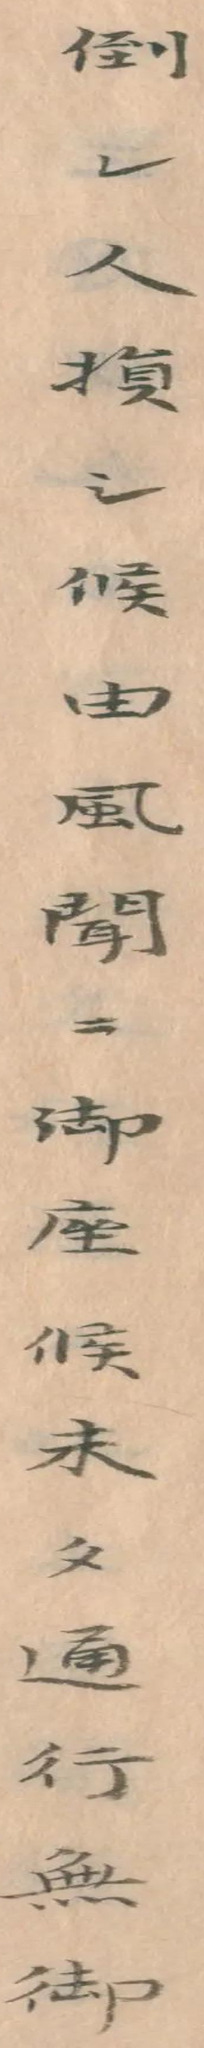倒レ人損シ候由風聞二御座候未タ通工無御
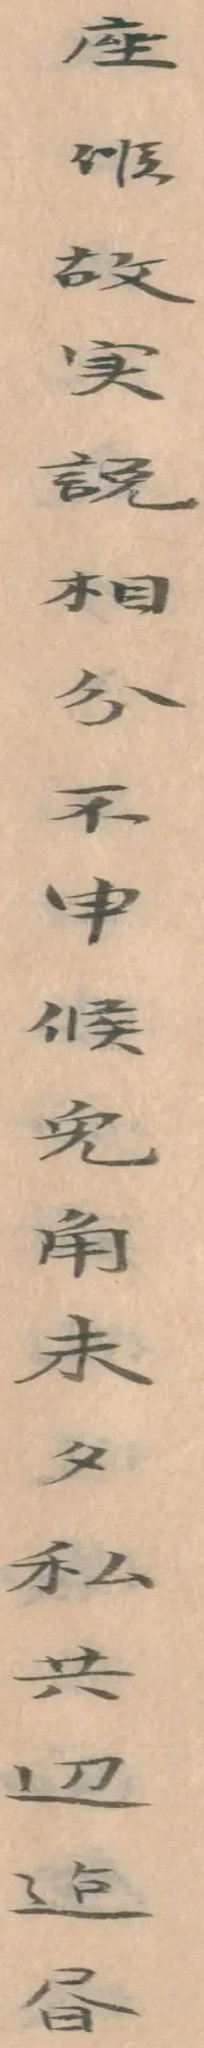座候故実説相分不申候兎角未タ私共辺迄昼

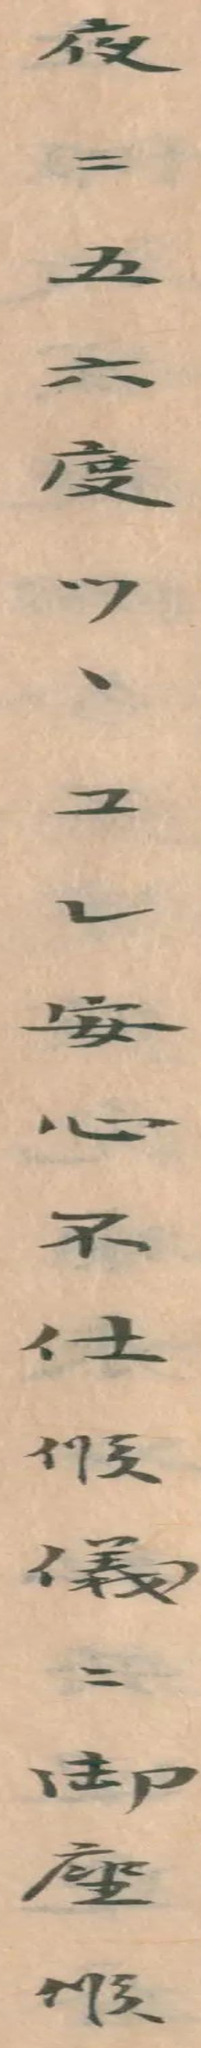夜二五六度ツゝユレ安心不仕候儀二御座候
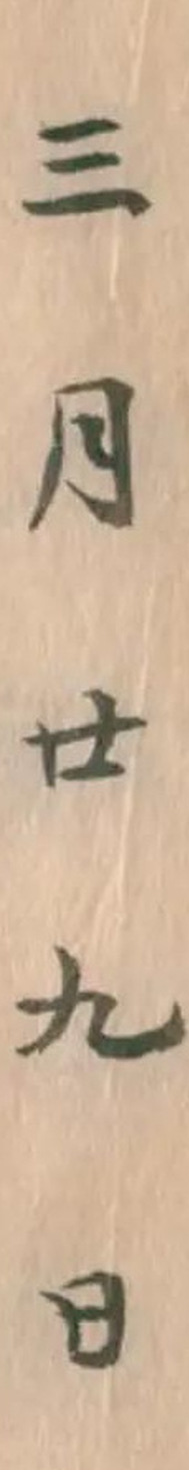三月廿九日
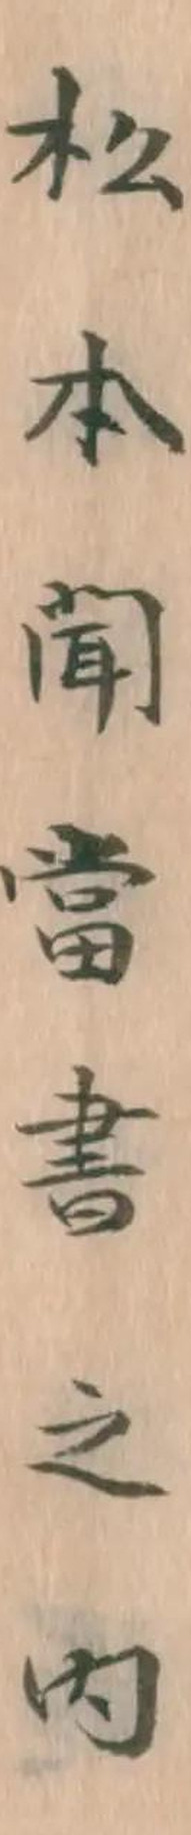松本聞当書之内
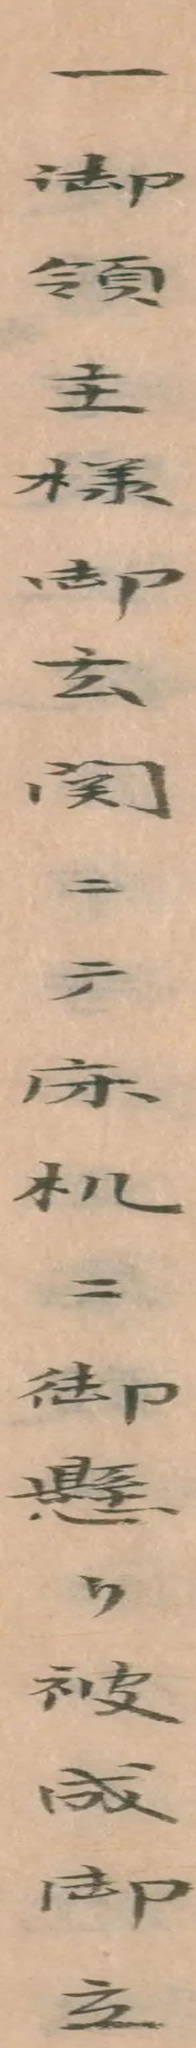一御領主様御玄関ニテ床机二御懸り被成御立
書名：地災撮要. 巻1(噴火山・地震ノ部)
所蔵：国立国会図書館 National Diet Library, JAPAN
